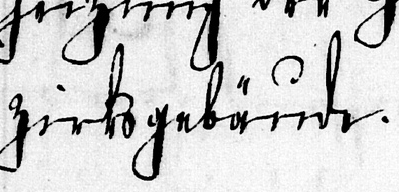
zirksgebäude.
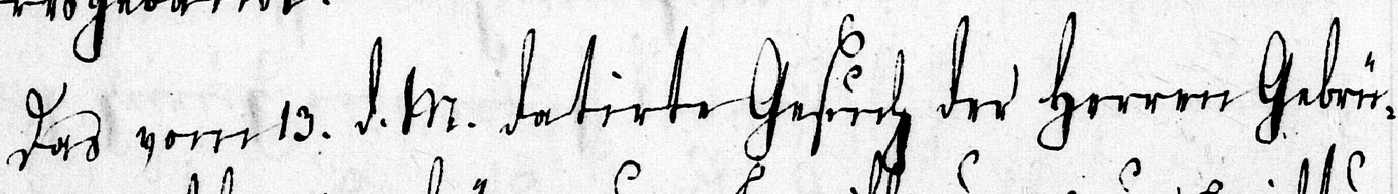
Das vom 13. d. M. datirte Gesuch der Herren Gebrü¬
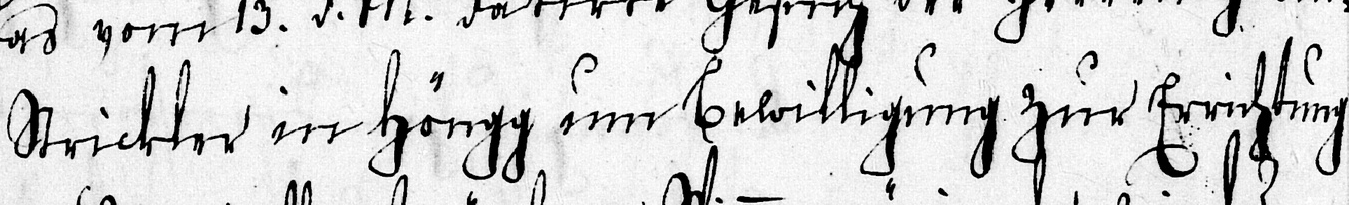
Strickler in Höngg um Bewilligung zur Errichtung
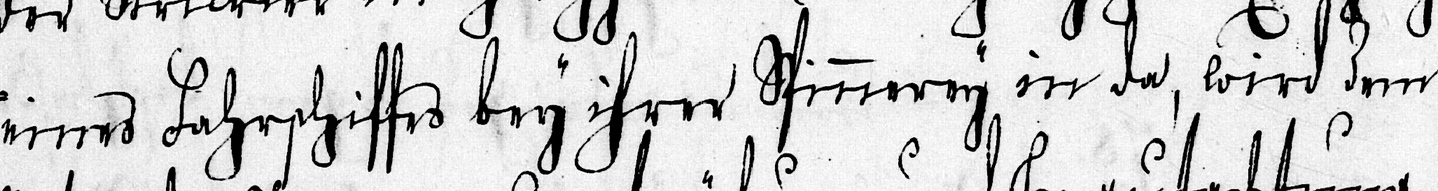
eines Fahrschiffes bey ihrer Spinnerey in da, wird dem
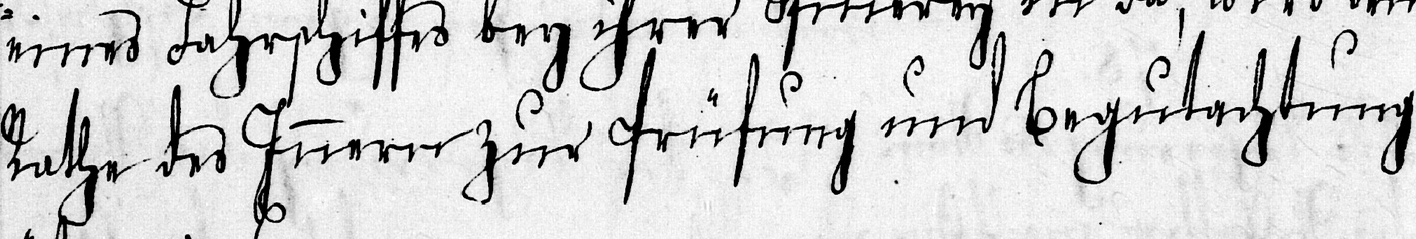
Rathe des Innern zur Prüfung und Begutachtung
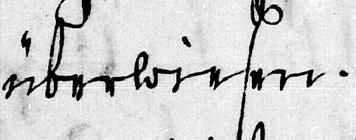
überwiesen.
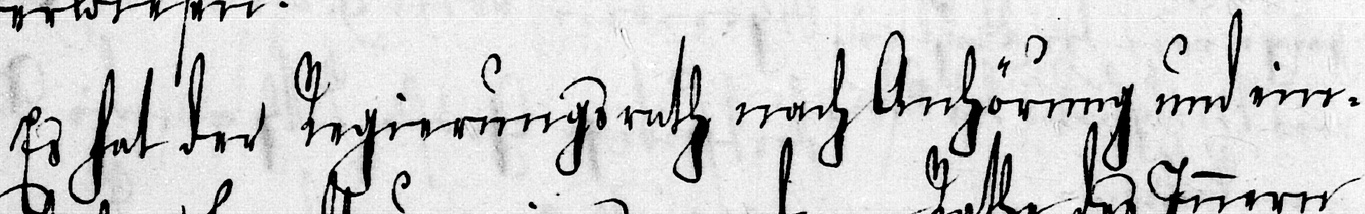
Es hat der Regierungsrath nach Anhörung und ein¬
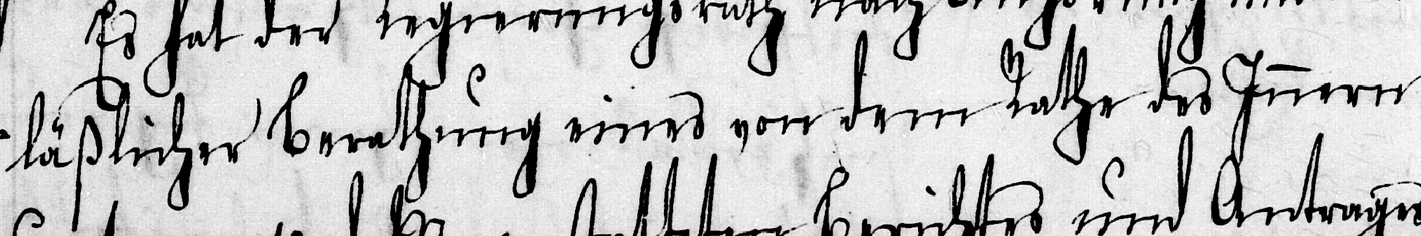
läßlicher Berathung eines von dem Rathe des Innern
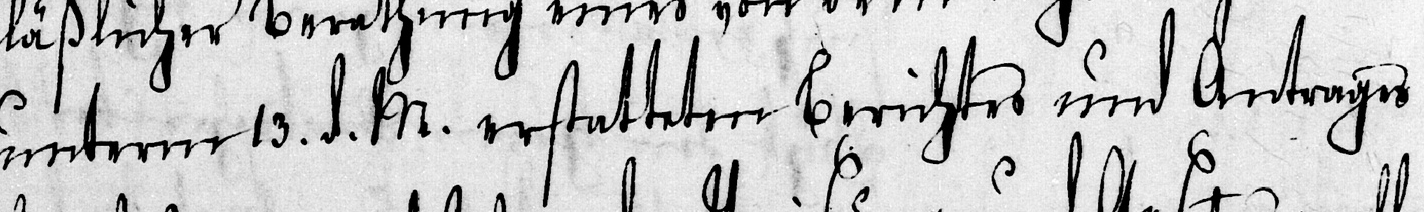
unterm 13. d. M. erstatteten Berichtes und Antrages
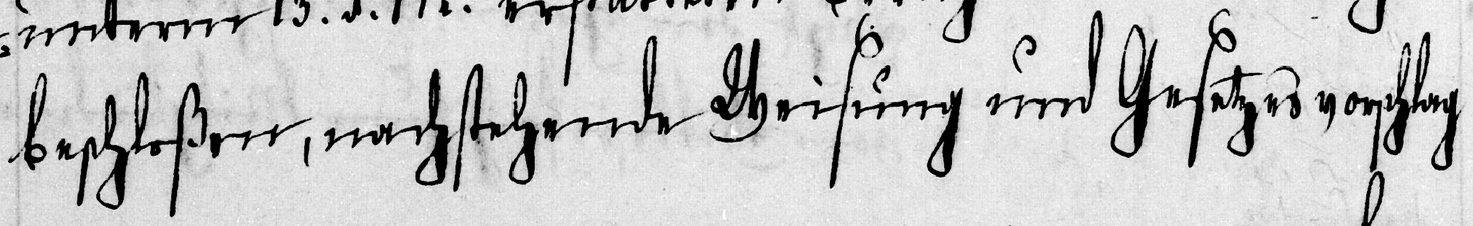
beschloßen, nachstehende Weisung und Gesetzesvorsch¬
